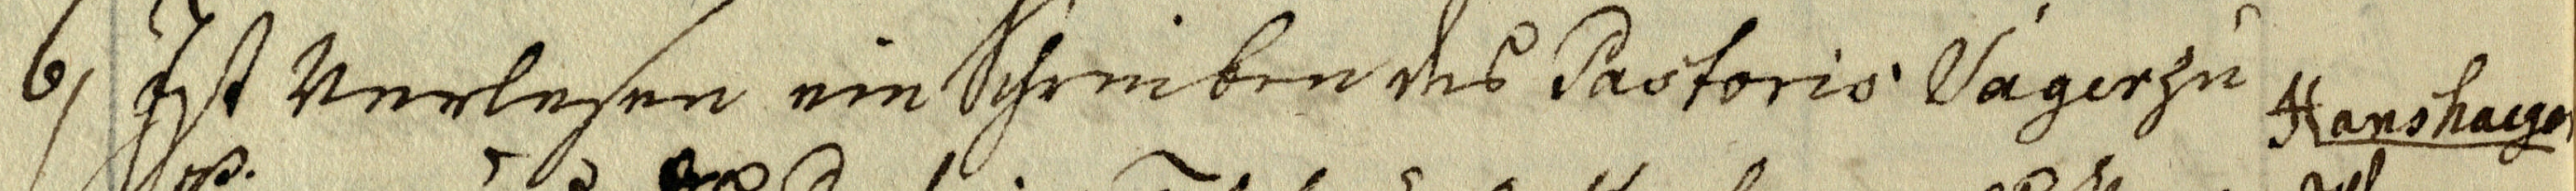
6, Ist verlesen ein Schreiben des Pastoris Sager zu Hanshagen
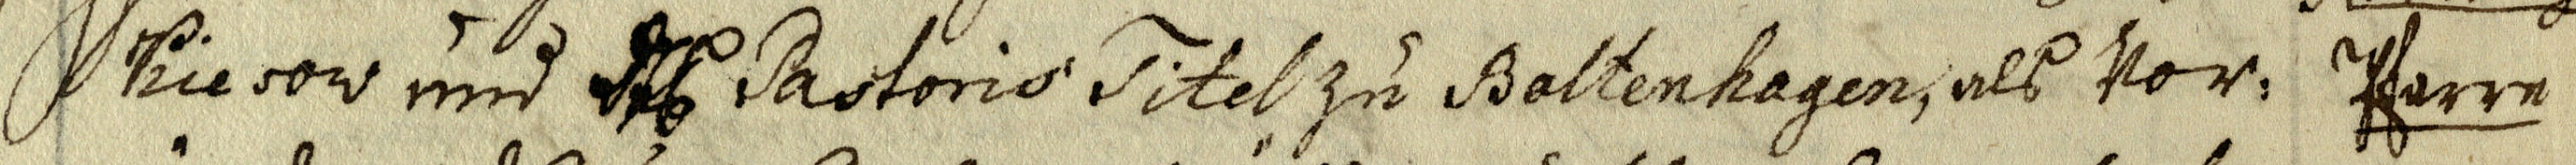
Kiesow und dh Pastoris Titel zu Boltenhagen, als Vor- Pfarre
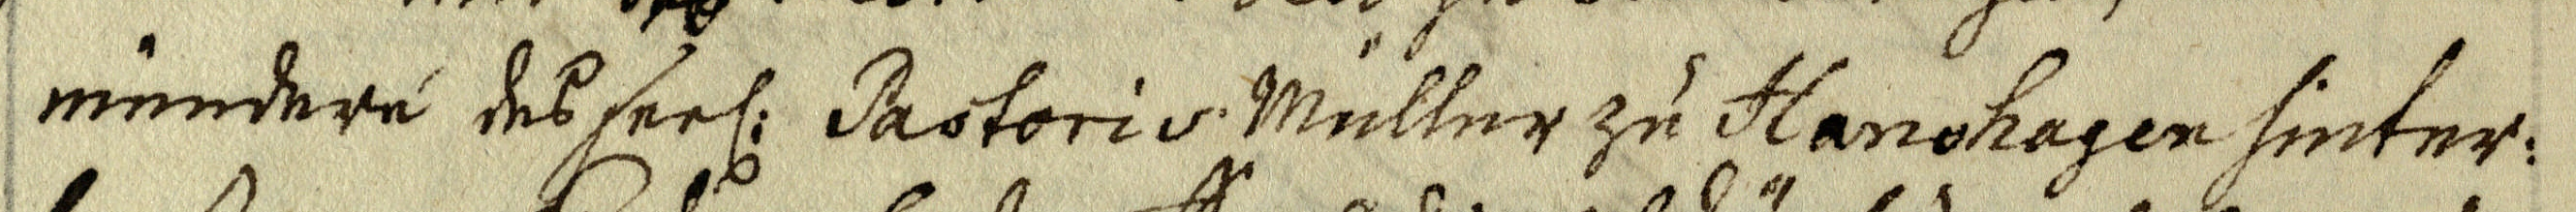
mündern des seel: Pastoris Müller zu Hanshagen hinter¬
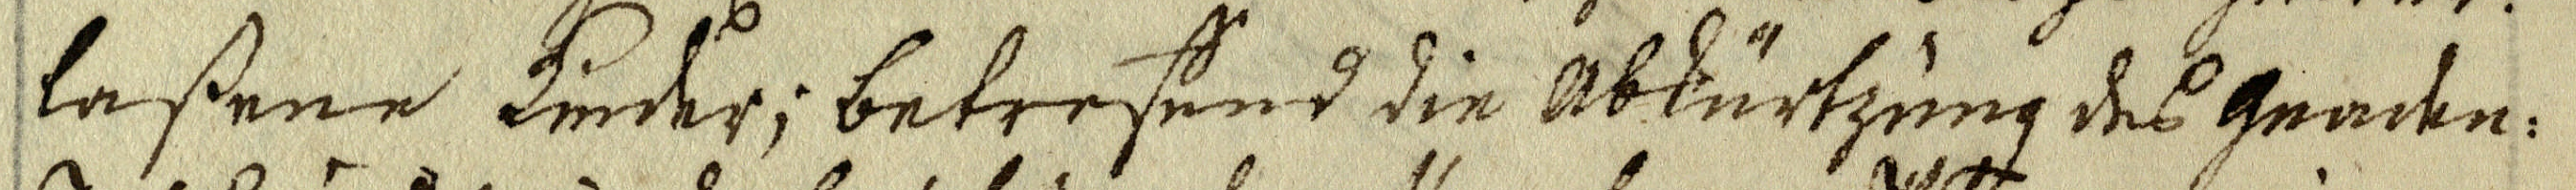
laßene Kinder; betreffend die Abkürtzung des Gnaden¬
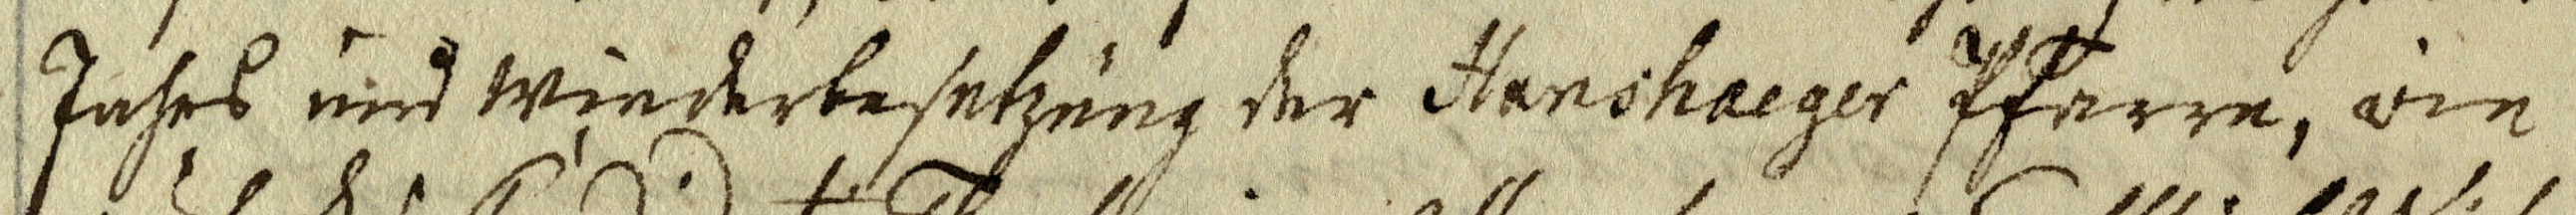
Jahrs und Wiederbesetzung der Hanshaeger Pfarre, wie
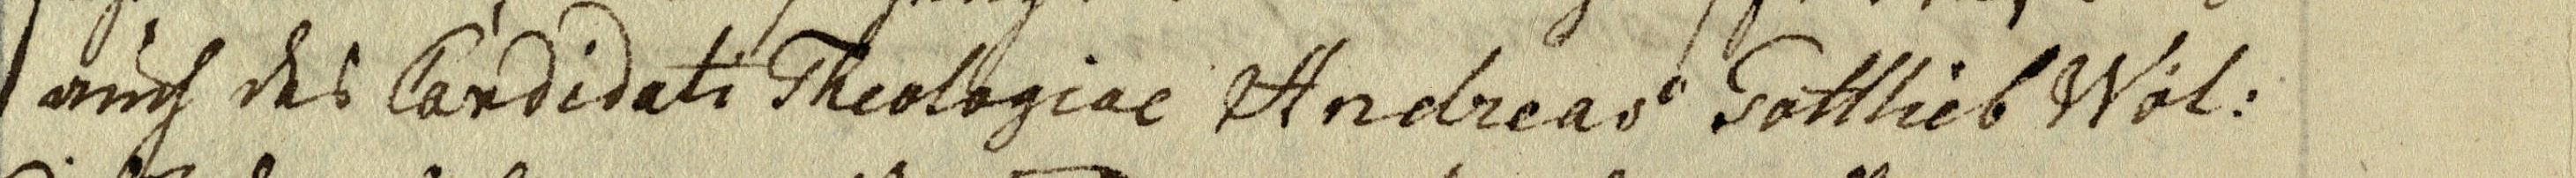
auch des Candidati Theologiae Andreas Gottlieb Wöl¬
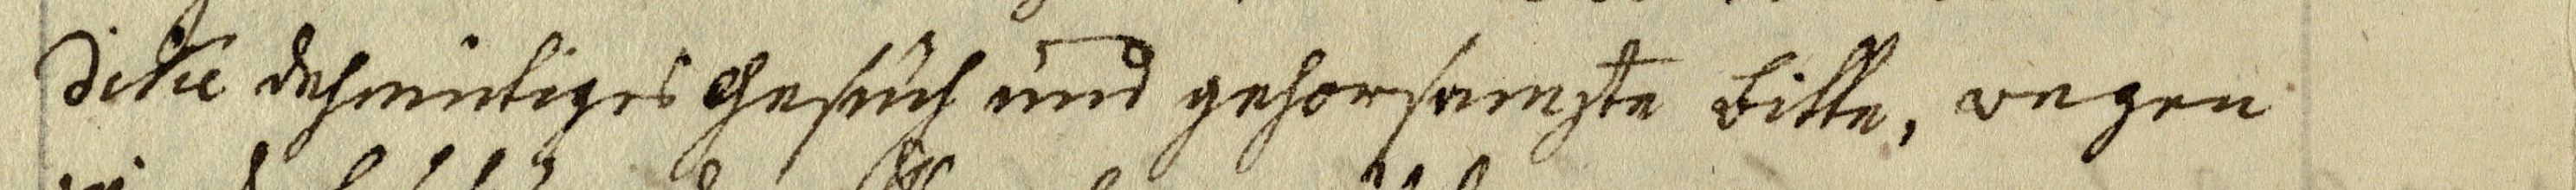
dike dehmütiges Gesuch und gehorsamste Bitte, wegen
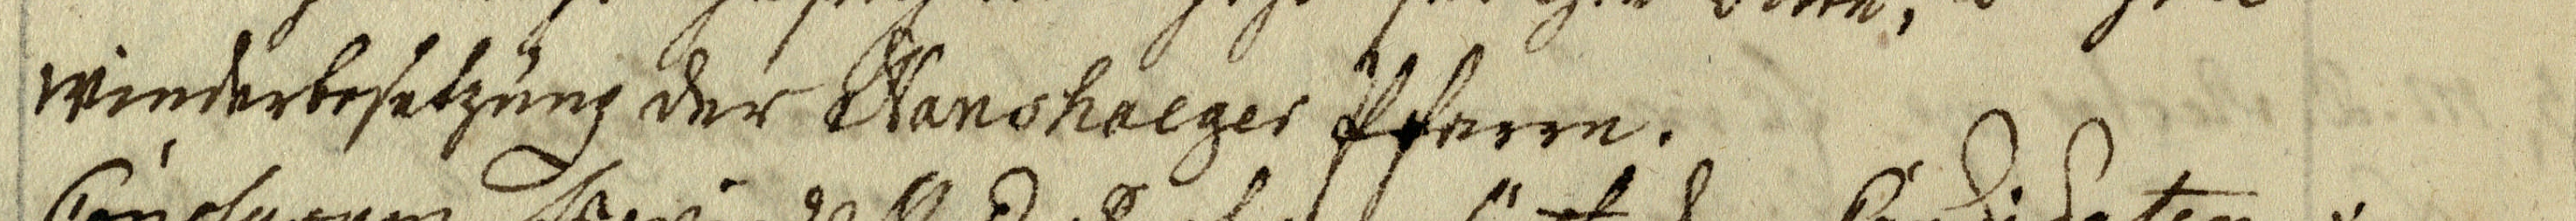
Wiederbesetzung der Hanshaeger Pfarre.
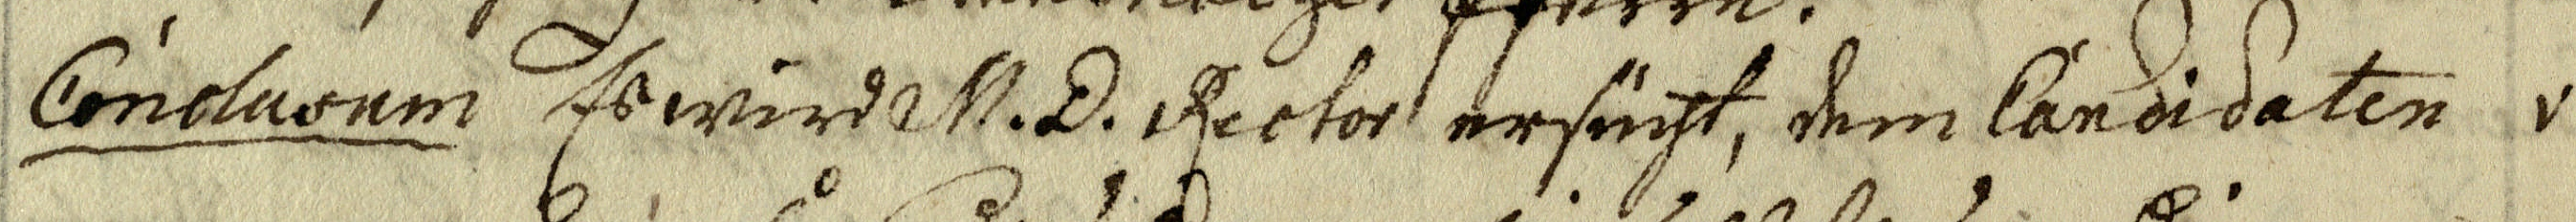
Conclusum Es wird M. D. Rector ersucht, dem Candidaten
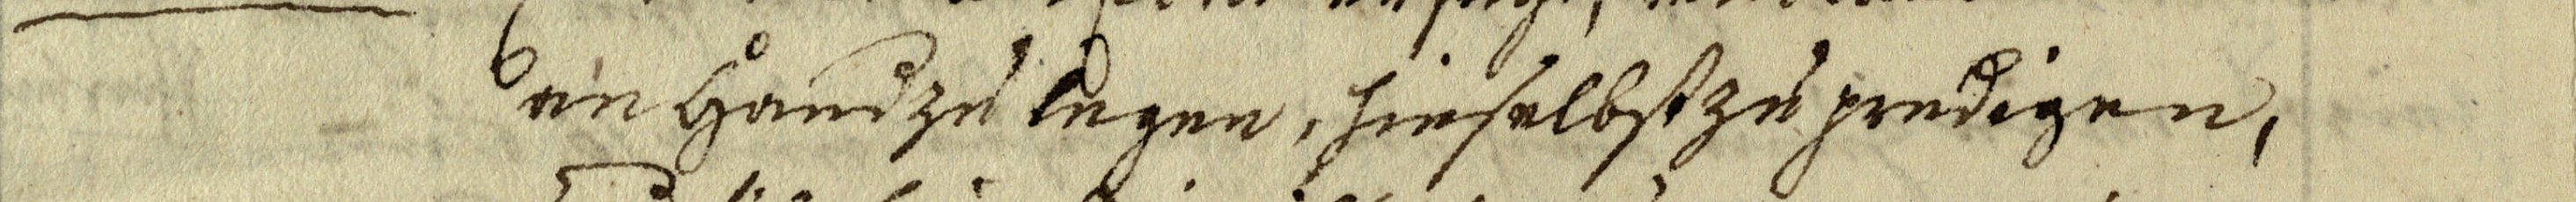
an Hand zu legen, hieselbst zu predigen,
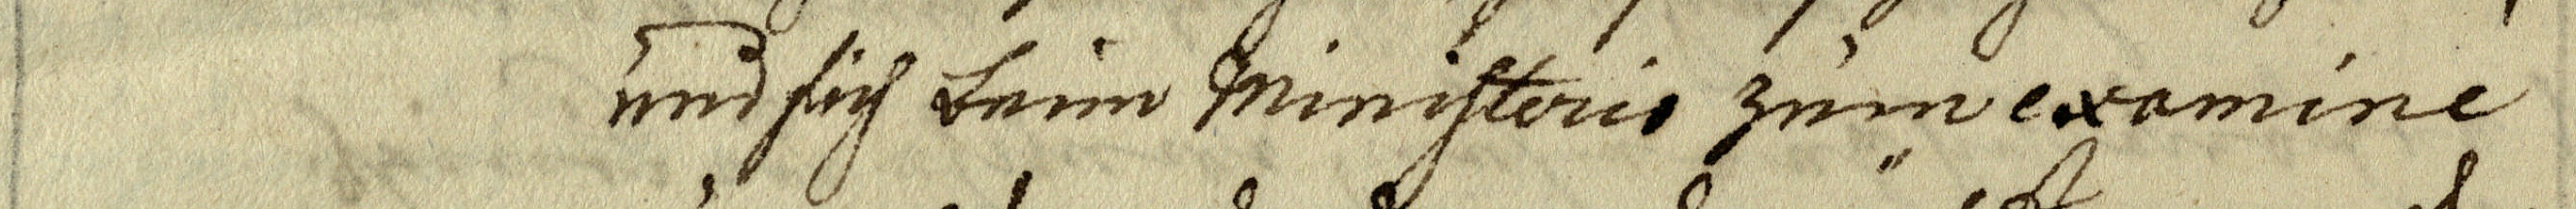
und sich beim Ministerio zum examine
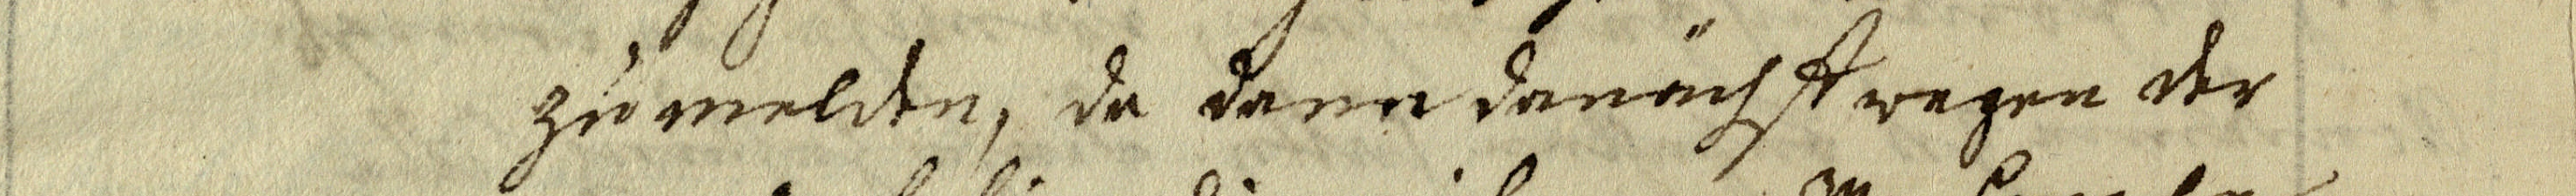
zu melden, da dann danächst wegen der
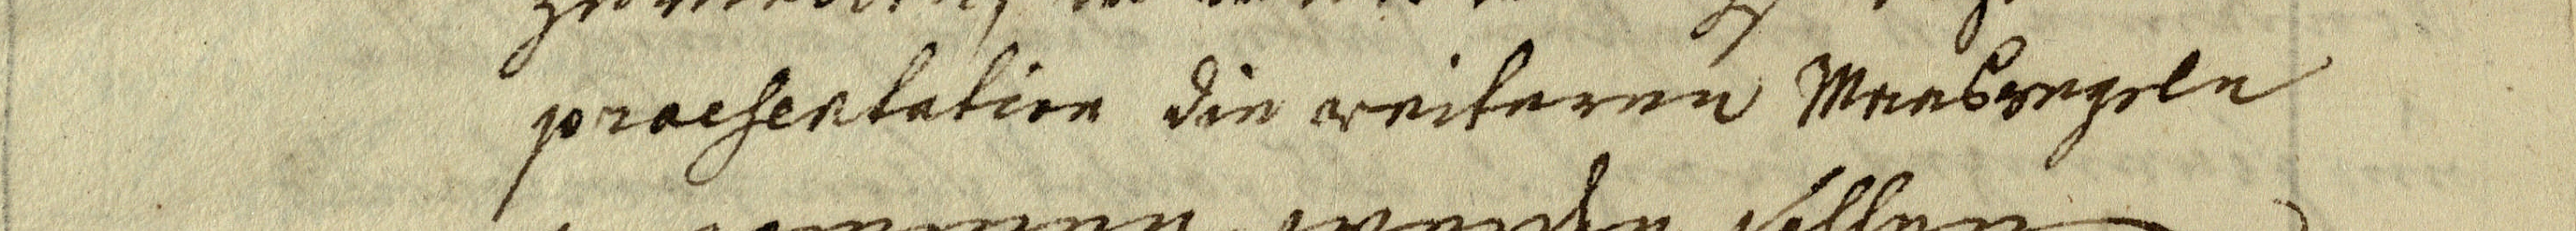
praesentation die weiteren Maasregeln
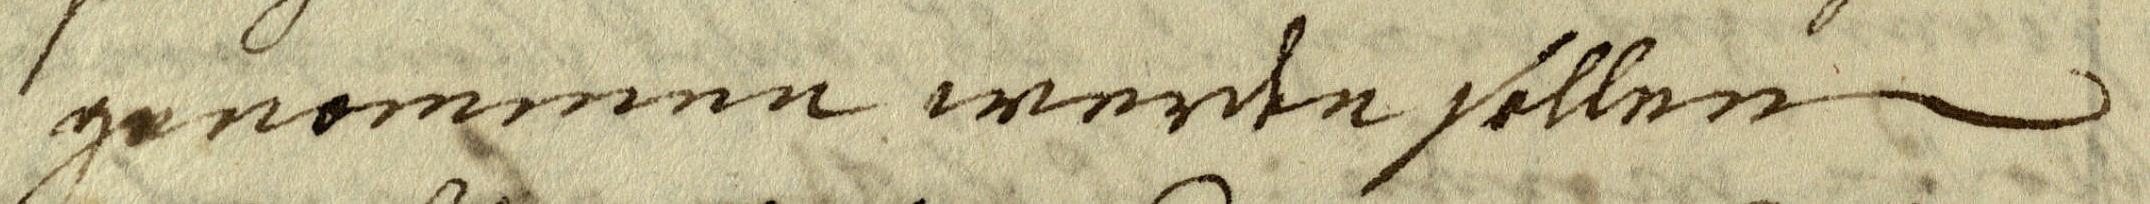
genommen werden sollen
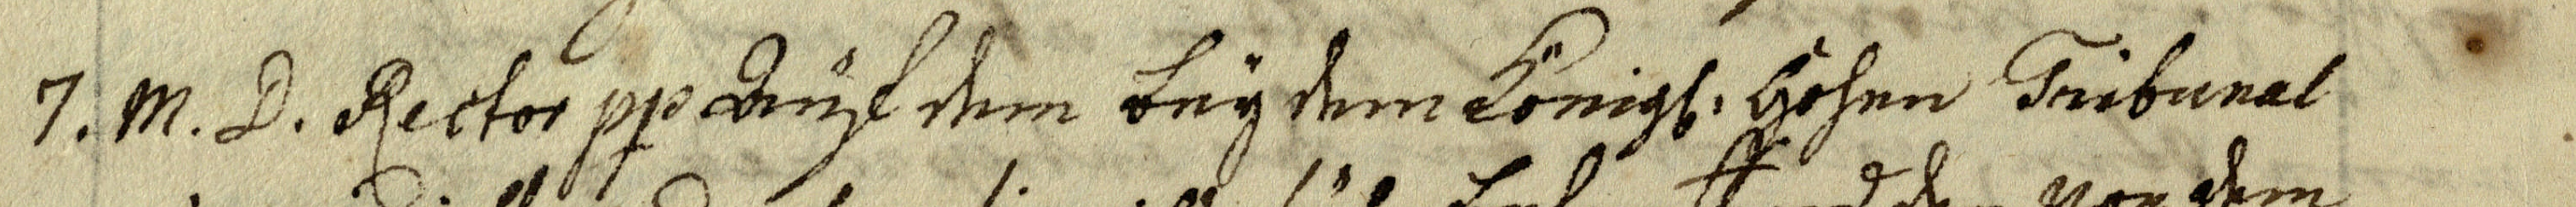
7. M. D. Rector pp Auf dem beÿ dem Königl: Hohen Tribunal
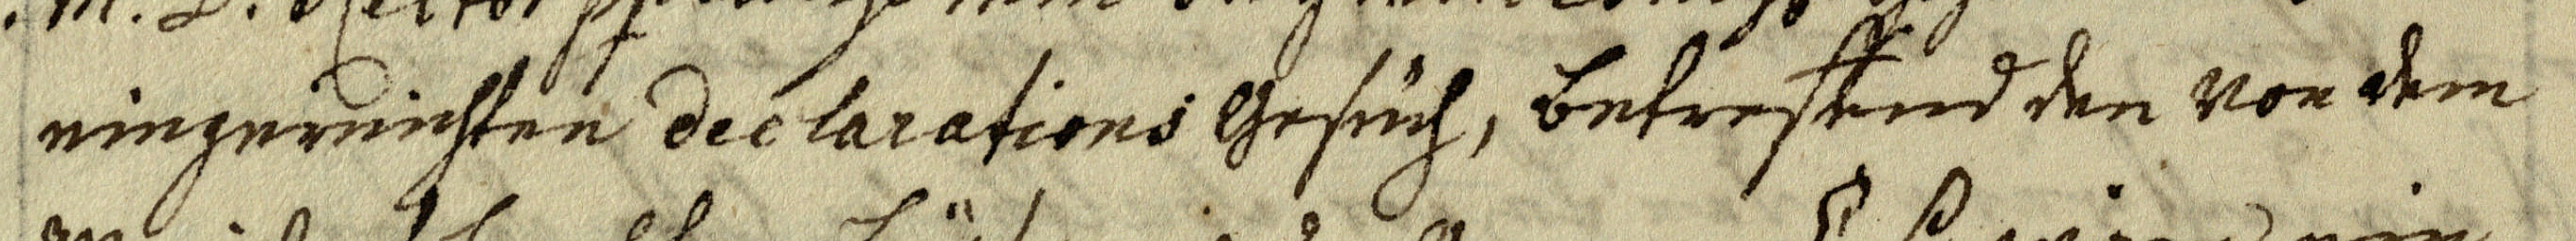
eingereichten declarations Gesuch, betreffend den von dem
